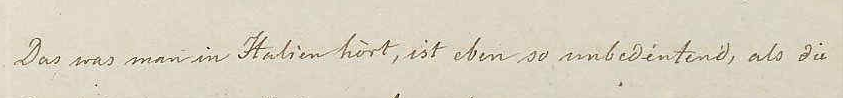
Das was man in Italien hört, ist eben so unbedeutend, als die
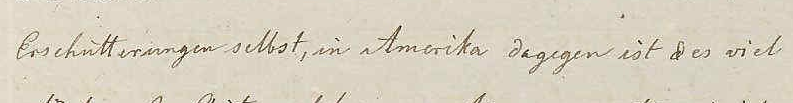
Erschütterungen selbst, in Amerika dagegen ist des viel
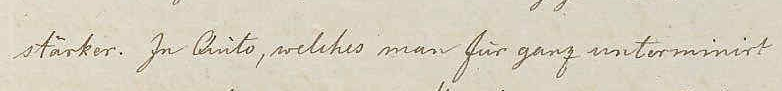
stärker. In Quito, welches man für ganz unterminirt
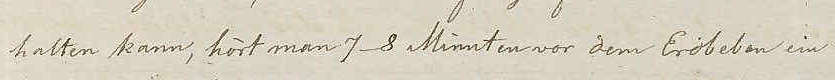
halten kann, hört man 7–8 Minuten vor dem Erdbeben ein
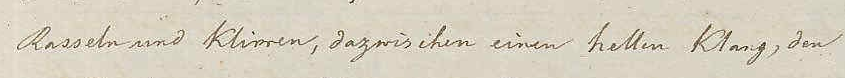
Rasseln und Klirren, dazwischen einen hellen Klang, den
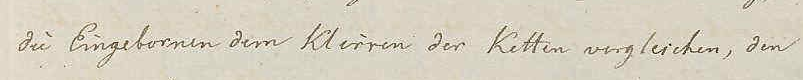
die Eingebornen dem Klirren der Ketten vergleichen, den
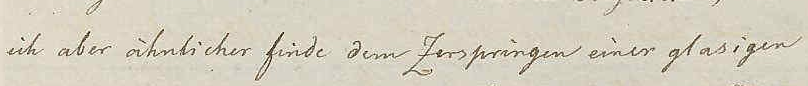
ich aber ähnlicher finde dem Zerspringen einer glasigen
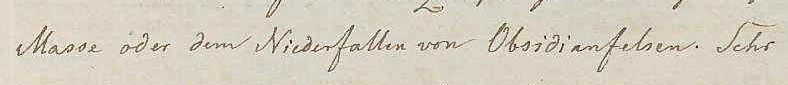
Masse oder dem Niederfallen von Obsidianfelsen. Sehr
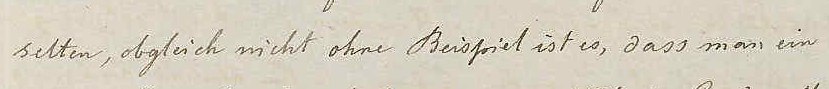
selten, obgleich nicht ohne Beispiel ist es, dass man ein
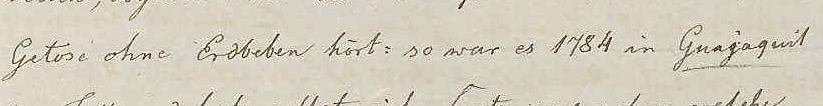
Getöse ohne Erdbeben hört: so war es 1784 in Guaiyaquil
